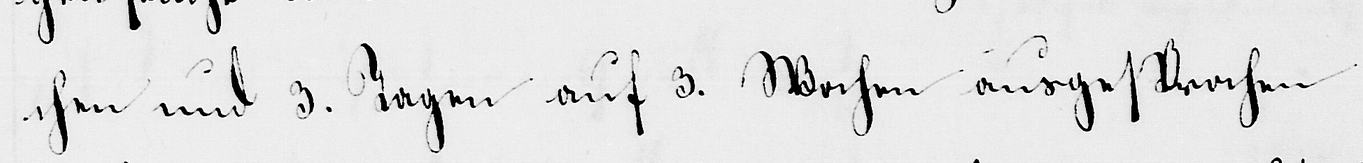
chen und 3. Tagen auf 3. Wochen ausgesprochen
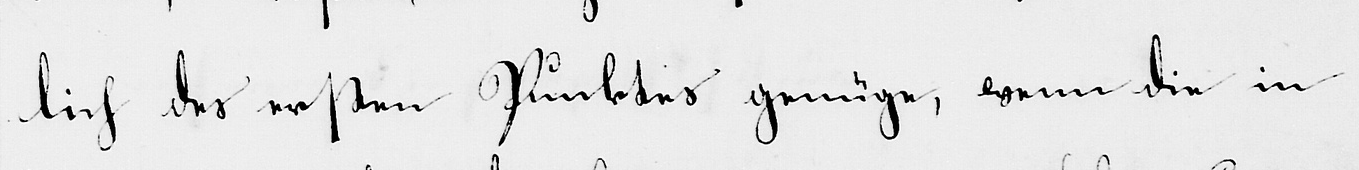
lich des ersten Punktes genüge, wenn die in
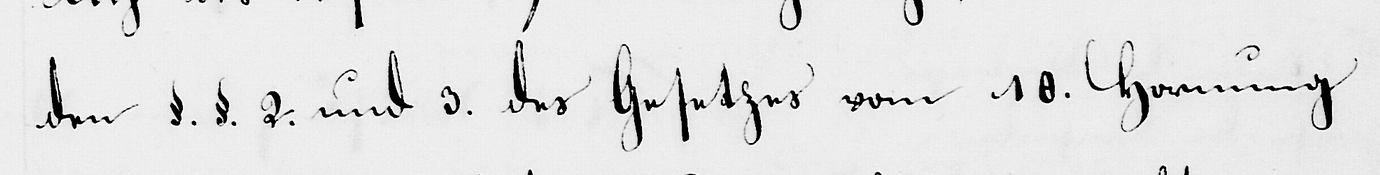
den §. §. 2. und 3. des Gesetzes vom 10. Hornung
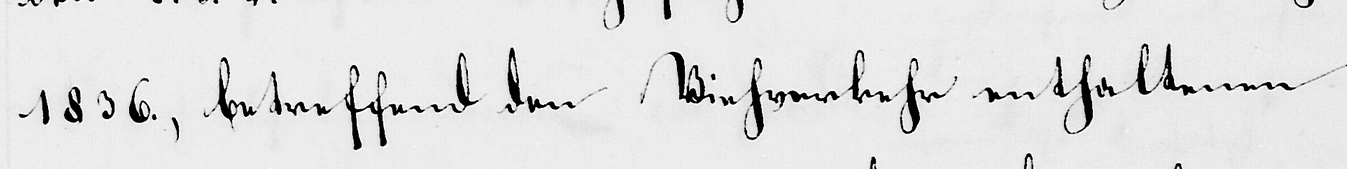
1836, betreffend den Viehverkehr enthaltenen
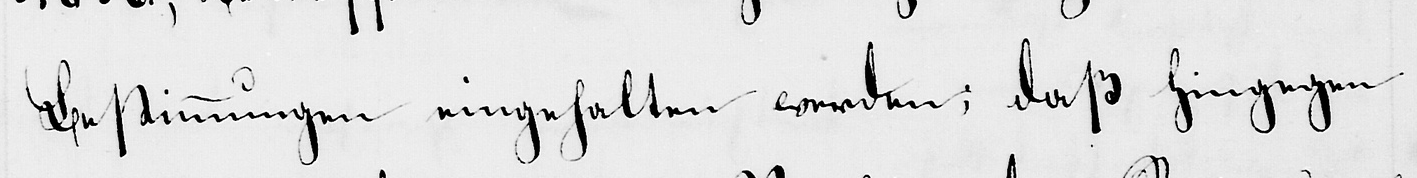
Bestimmungen eingehalten werden; daß hingegen
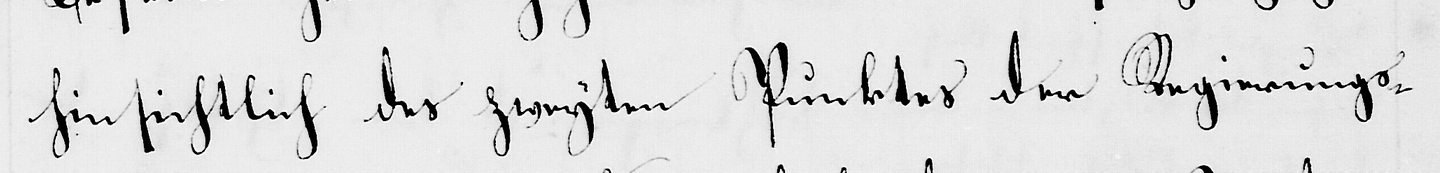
hinsichtlich des zweyten Punktes der Regierungs¬
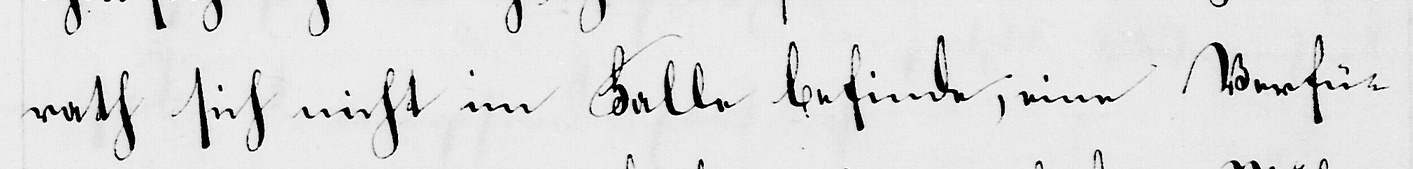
rath sich nicht im Falle befinde, eine Verfü¬
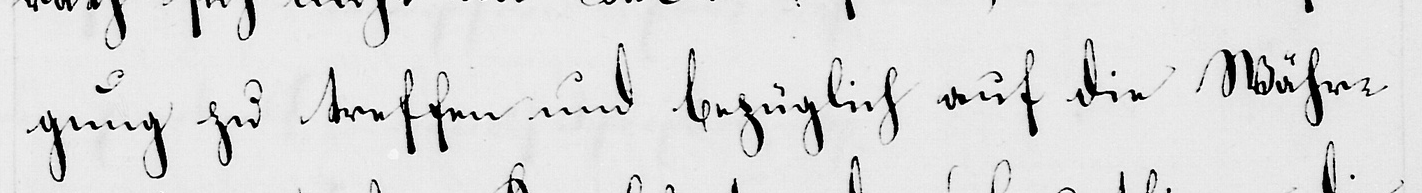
gung zu treffen und bezüglich auf die Währ¬
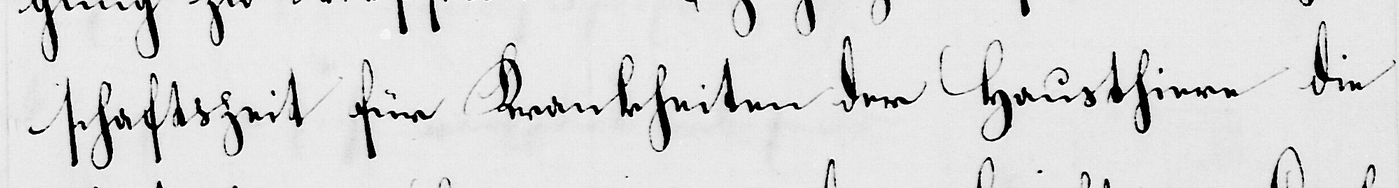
schaftszeit für Krankheiten der Hausthiere die
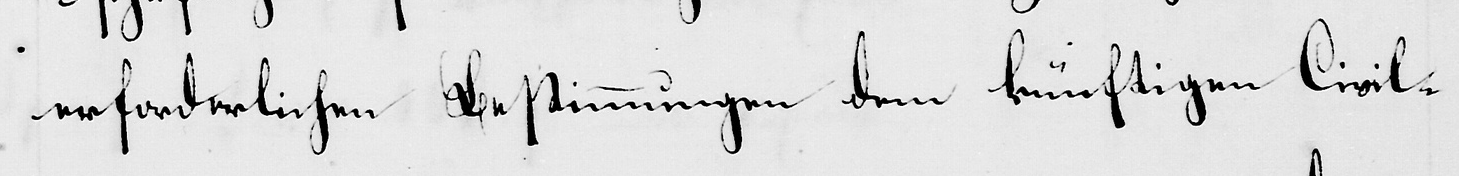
erforderlichen Bestimmungen dem künftigen Civil-
